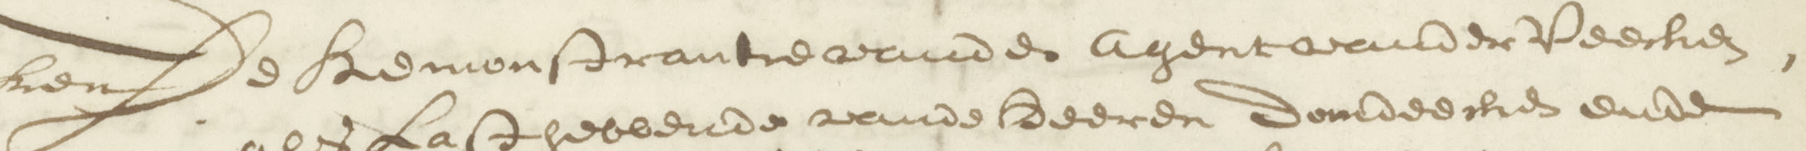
De Remonstrantie vanden Agent vander Veecken,
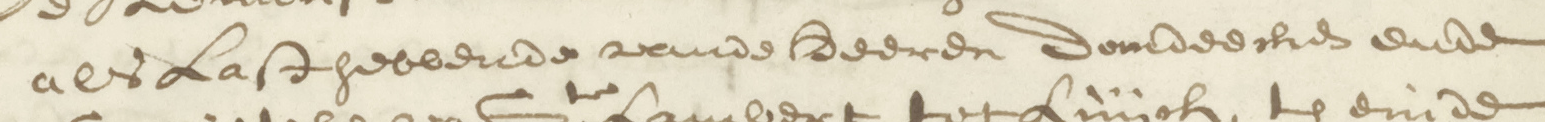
als Lasthebbende vande Heeren Domdeecken ende
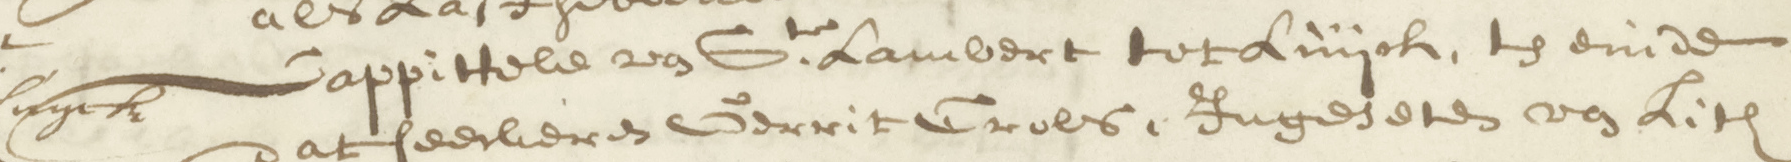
Cappittele van Ste.Lambert tot Luijck, ten einde
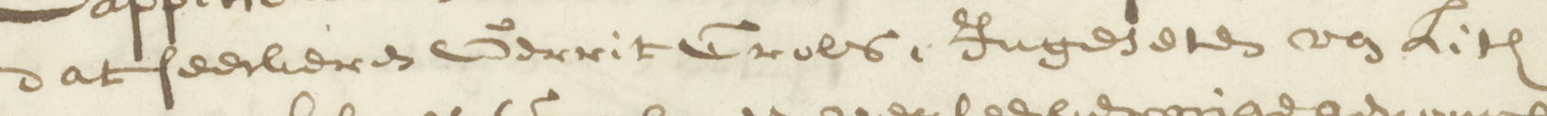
dat seeckeren Gerrit Crols, Ingeseten van Lith
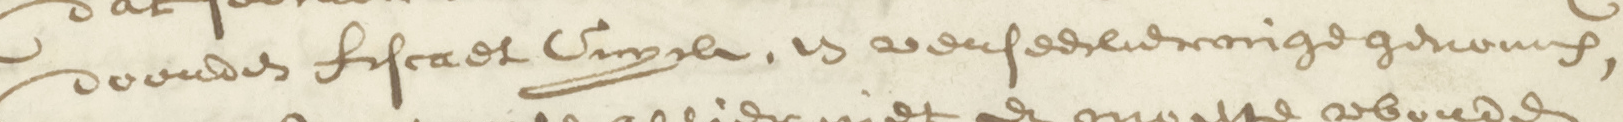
voor den fiscael Cuyck, in verseeckeringe genomen,
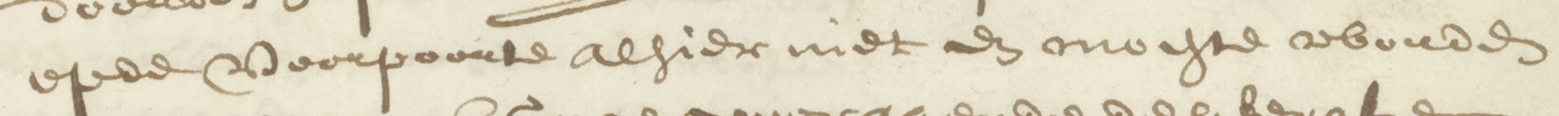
opde Voorpoorte alhier niet en mochte worden
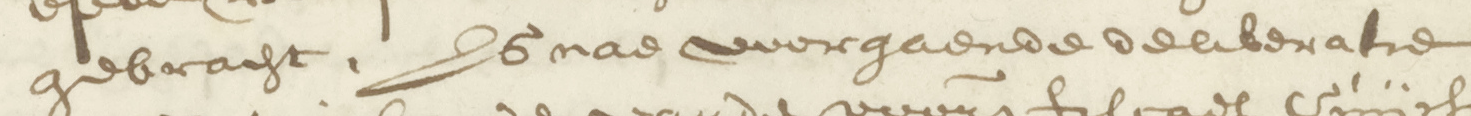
gebracht. Is nae voorgaende deliberatie
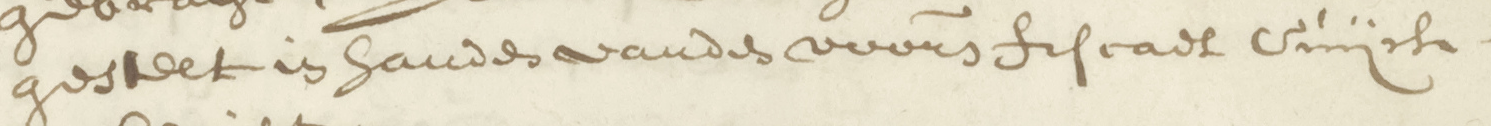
gestelt in handen vanden voors fiscael Cuijck
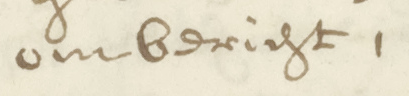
ombericht.
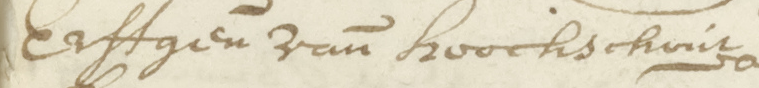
Erffgen van Hoochschout
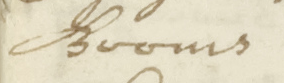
Booms
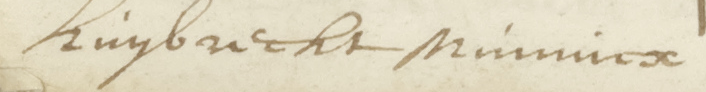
Huybrecht Munnicx
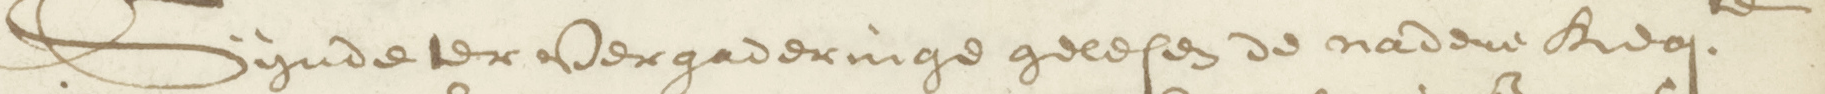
Sijnde ter Vergaderinge gelesen de nadere Reqte.
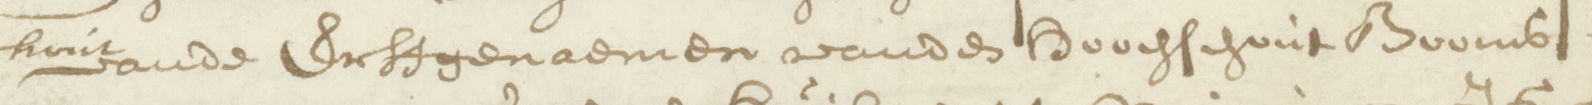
vande Erffgenaemen vanden Hoochschout Booms
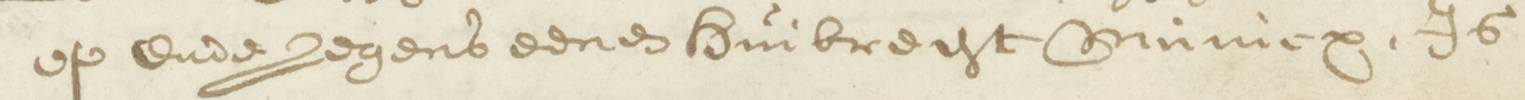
op ende Jegens eenen Huibrecht Municx, Is
